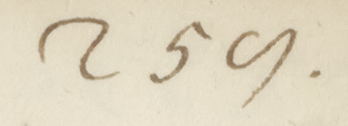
258.
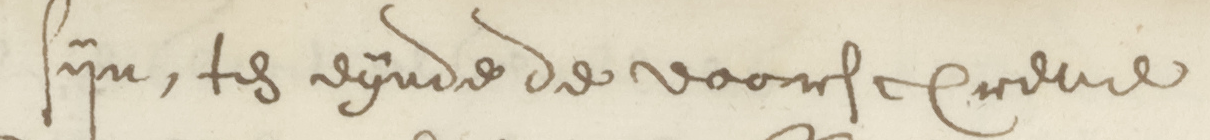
sijn, ten eijnde de voorschreve
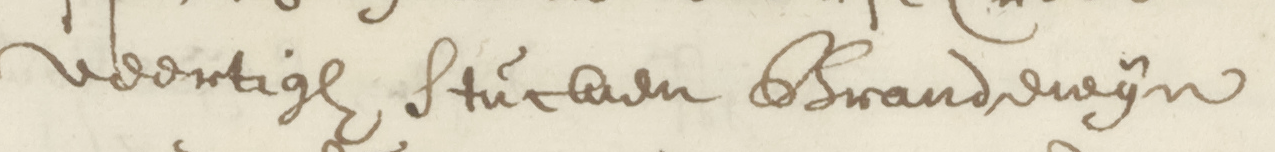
veertigh stucken Brandewijn
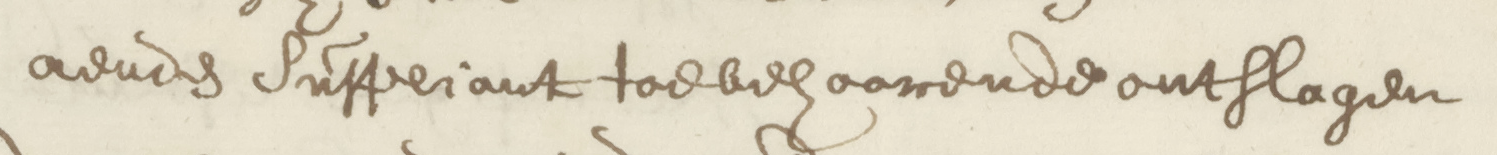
aenden Suppliant toebehoorende ontslagen
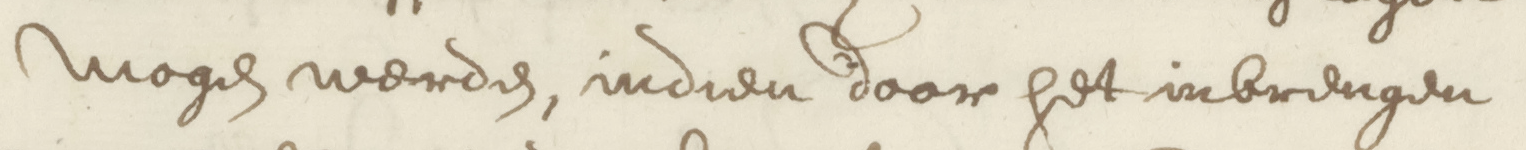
mogen werden, indien door het inbrengen
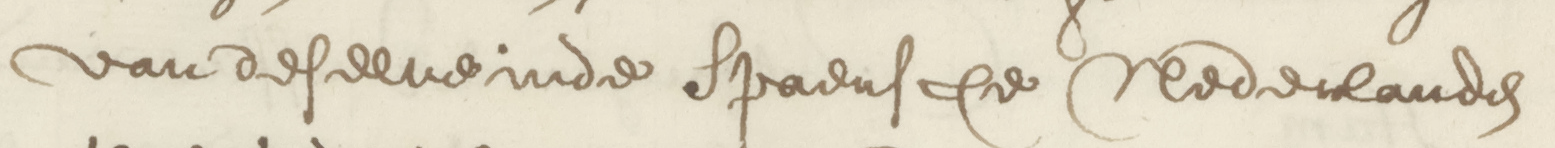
van deselve inde Spaensche Nederlanden
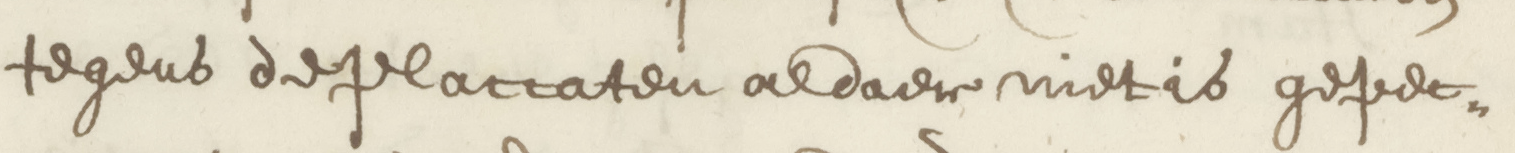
tegens de placcaten aldaer met is gepec„
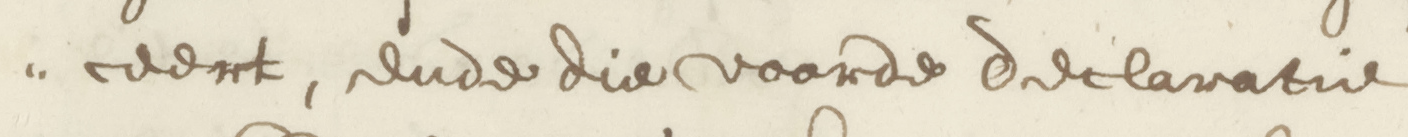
„ceert, ende die voorde declaratie
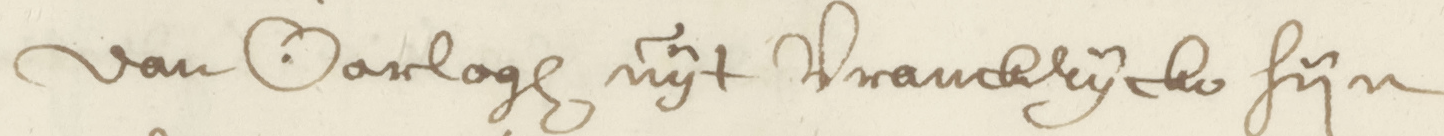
van Oorlogh uijt Vranckrijck sijn
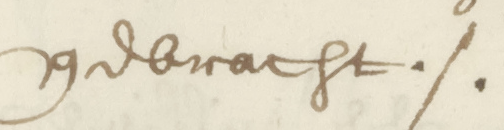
gebracht.
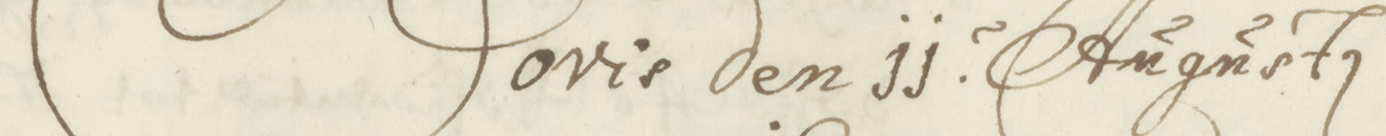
Jovis den 11e Augustij
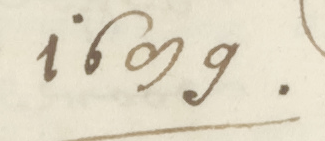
1689.
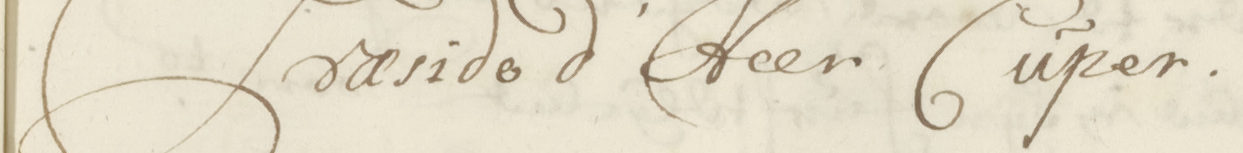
Præside d'Heer. Cuper.
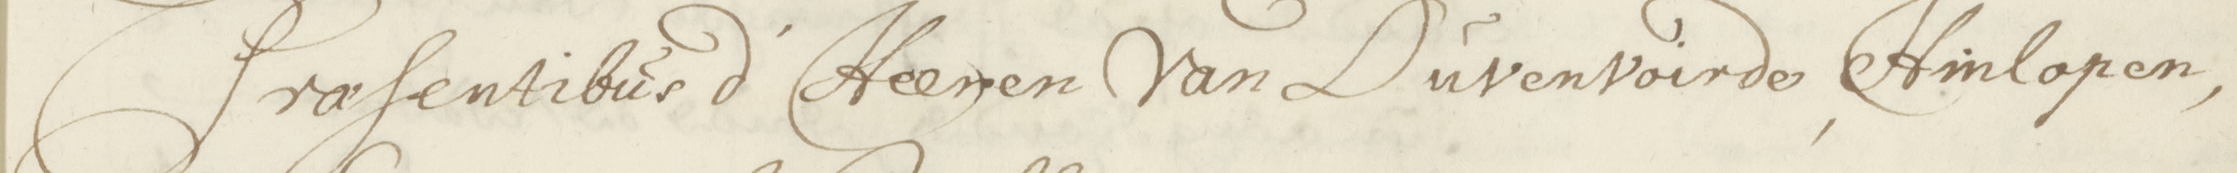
Præsentibus d'Heeren van Duvenvoirde, Hinlopen
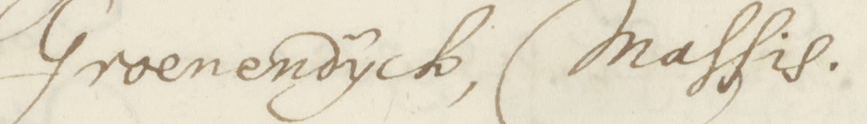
Groenendijck, Massis.
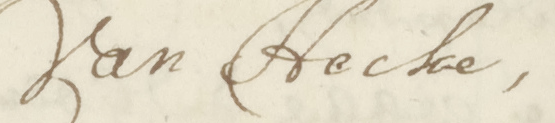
van Hecke,
